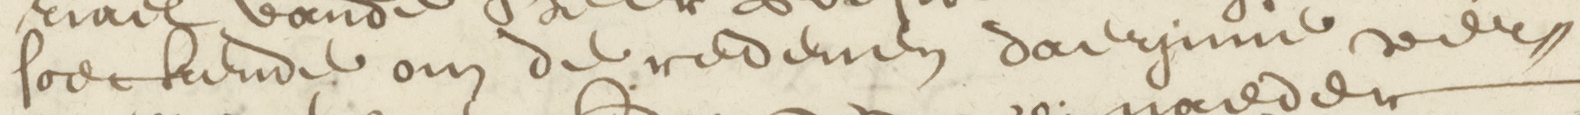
soeckende om de redenen daerinne ver„
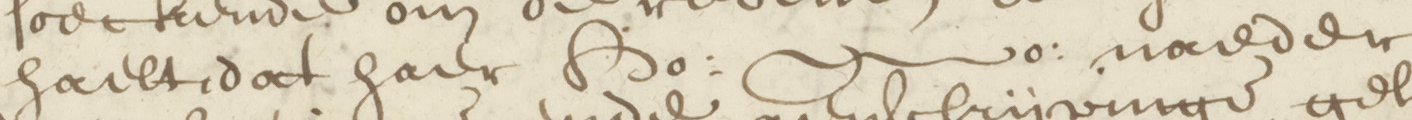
haelt, dat haer Ho:Mo: naeder
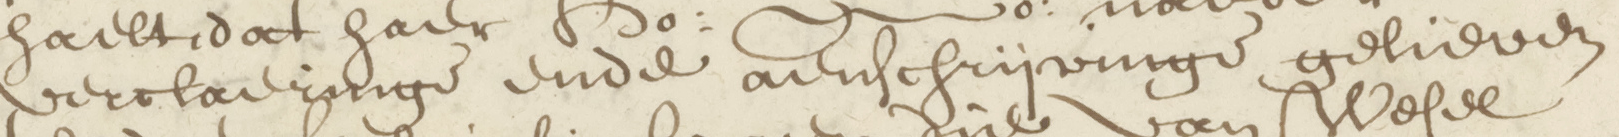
verclaeringe ende aenschrijvinge gelieven
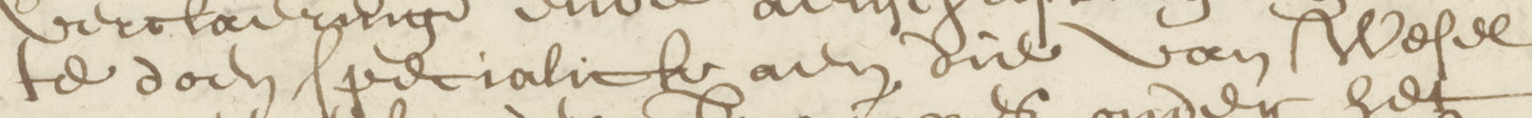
te doen specialick aen die van Wesel
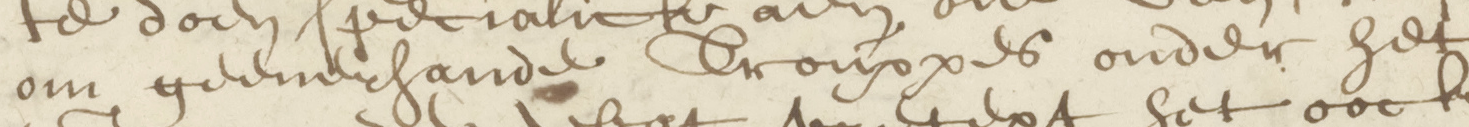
om geenerhande Trouppes onder het
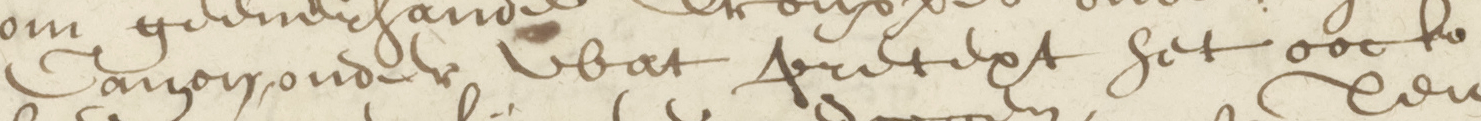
Canon, onder wat pretext het oock
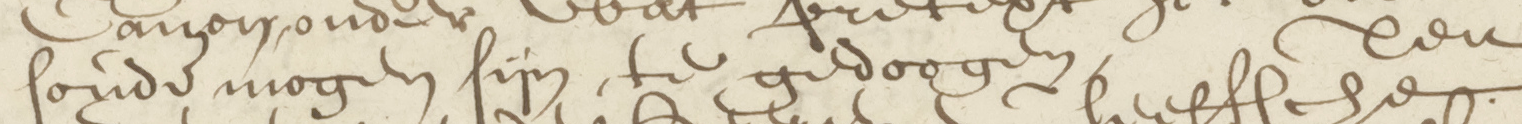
soude mogen sijn, te gedoogen, ten
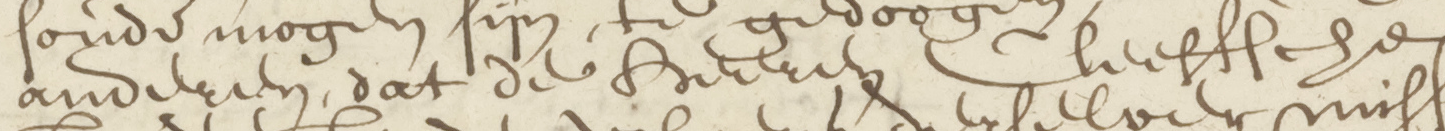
anderen, dat de Heeren Cleeffsche
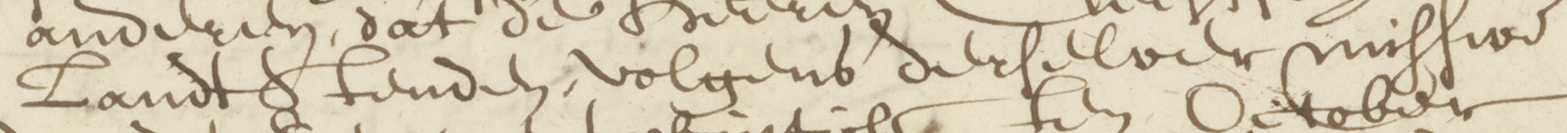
Landt Stenden, volgens derselver missive
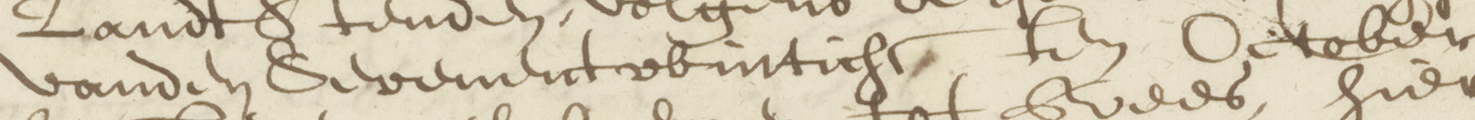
vanden Sevenentwintichsten October
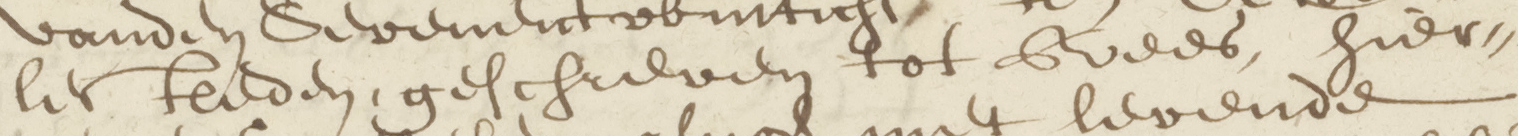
lestleden, geschreven tot Rees, hier„
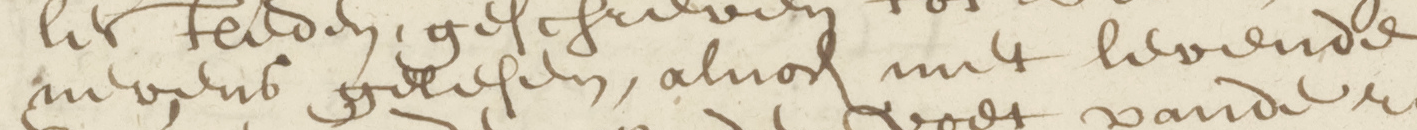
nevens gelesen, alnoch met levende
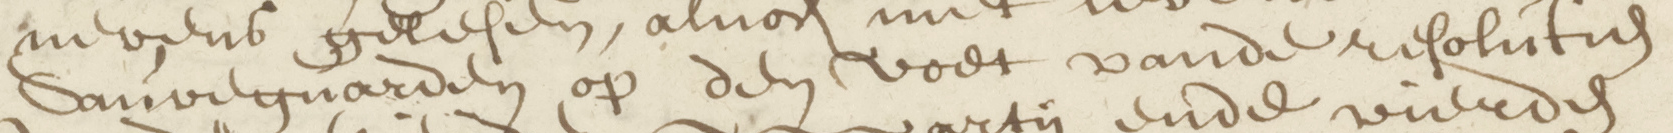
Sauveguarden op den voet vande resolutien
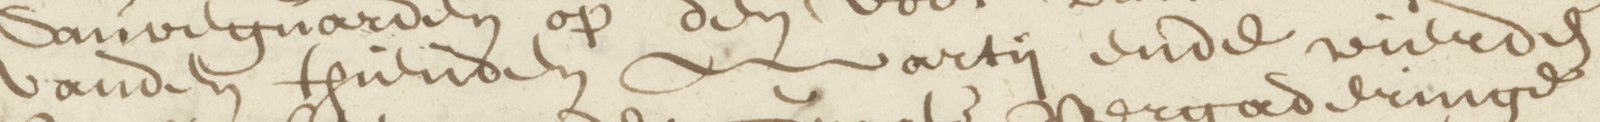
vanden thienden Martij ende vierden
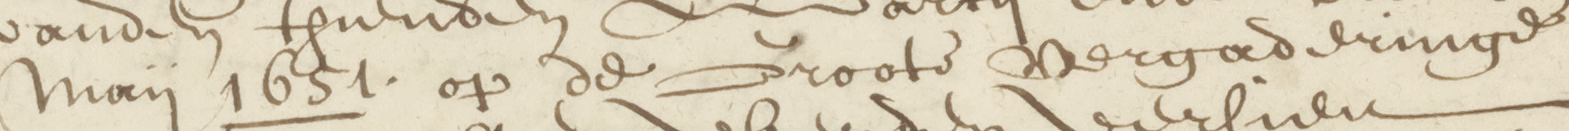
Maij 1651. op de Groote Vergaderinge
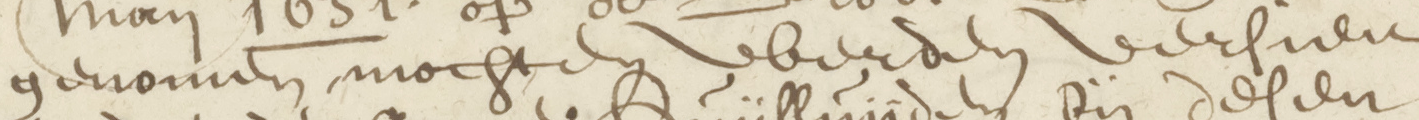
genomen, mochten werden versien
